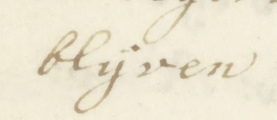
blijven
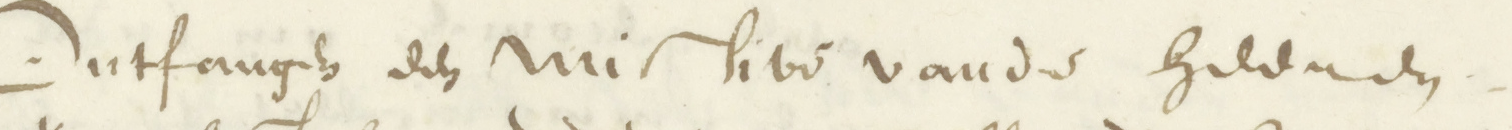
Ontfangen een Missive vande heeren
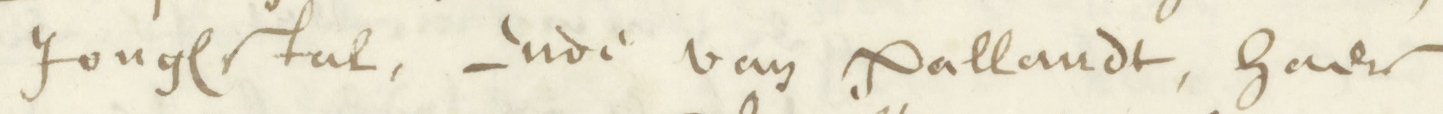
Jonghstal, ende van Pallandt, haer
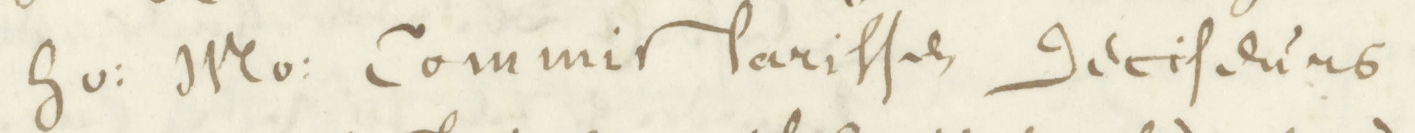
ho:Mo: Commissarissen Deciseurs
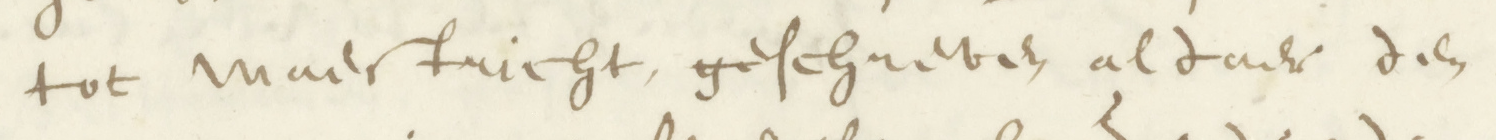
tot maestricht, geschreven aldaer den
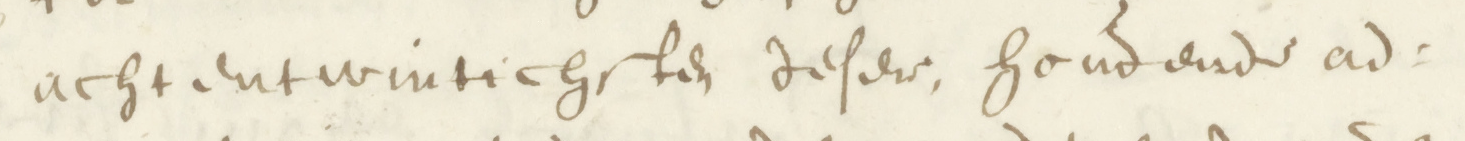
achtentwintichsten deser, houdende ad„
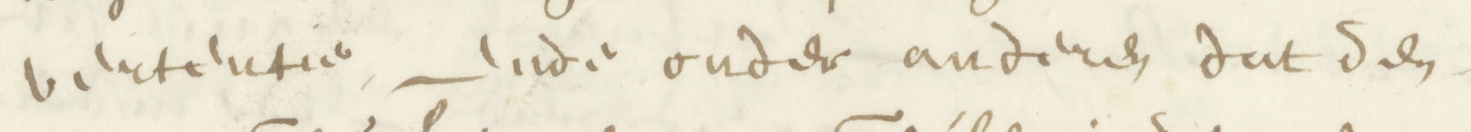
vertentie, ende onder anderen dat den
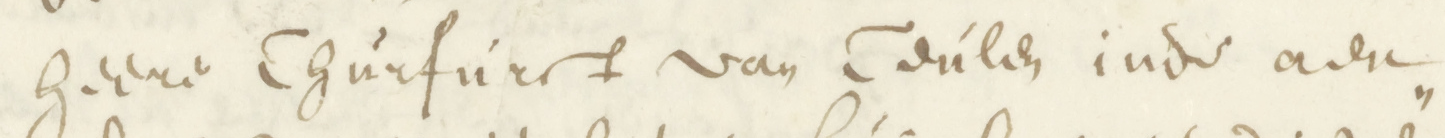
heere Churfurst van Ceulen inde aen„
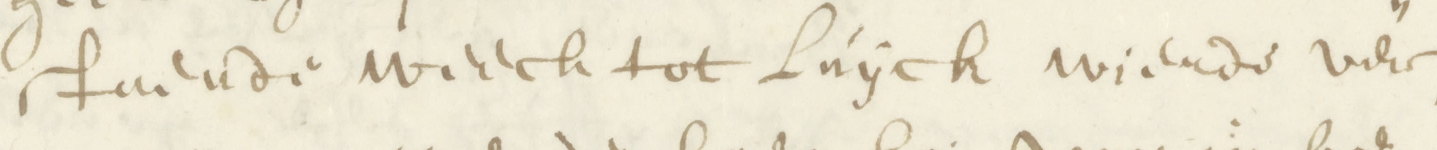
staende weeck tot Luijck wierde ver„
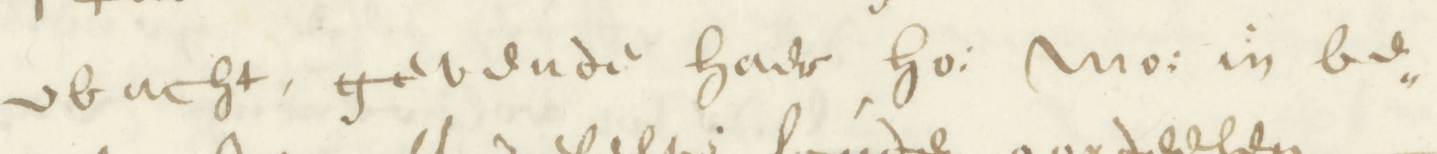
wacht, gevende haer ho:Mo: in be„
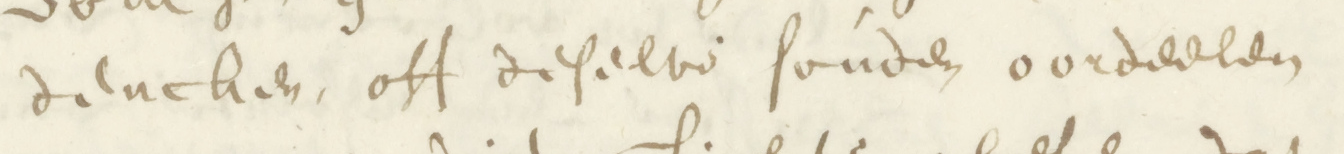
dencken, off deselve souden oordeelen
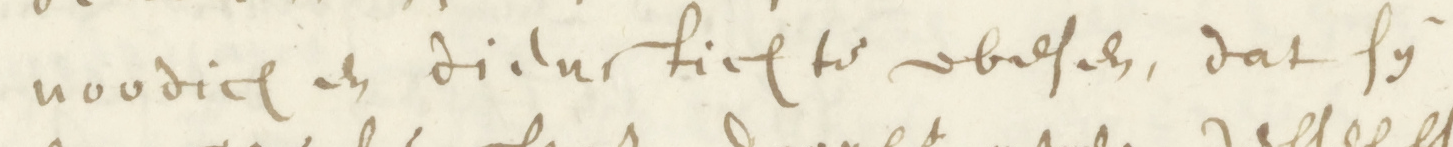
noodich en dienstich te wesen, dat sij
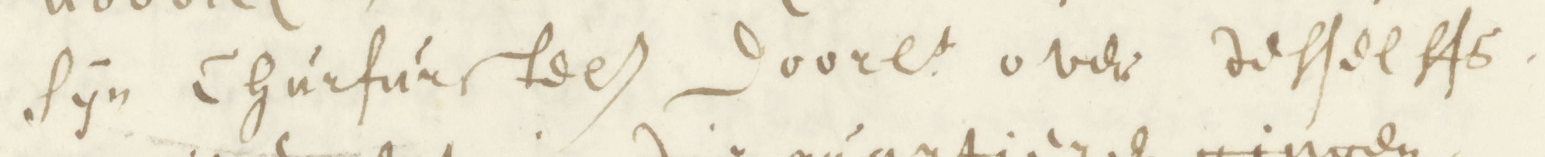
sijn Churfurstel Doorlt over desselffs
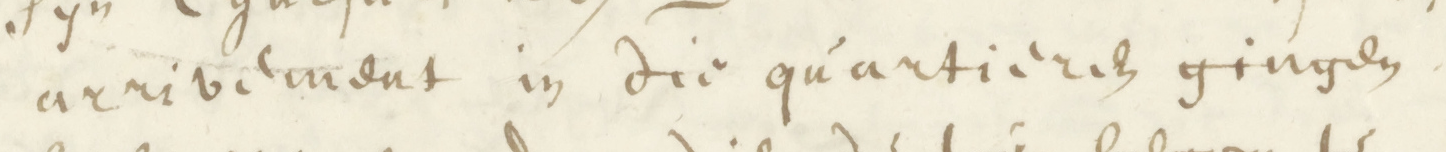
arrivement in die quartieren gingen
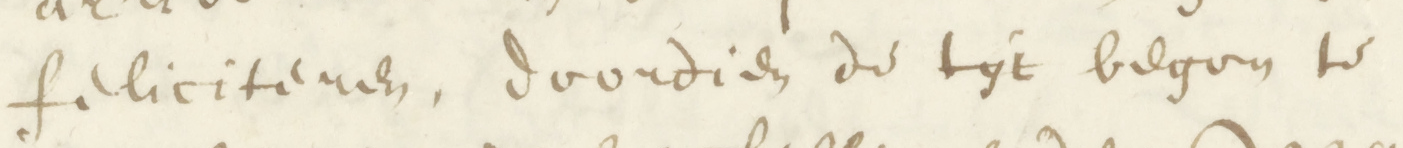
feliciteren, doordien de tijt begon te
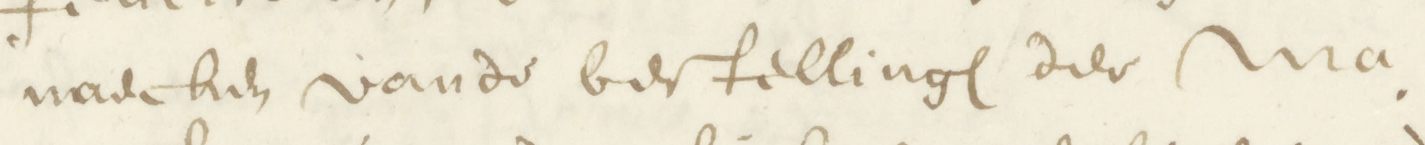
naecken vande bestellingh der Ma„
